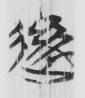後
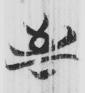至
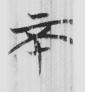不
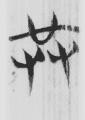共
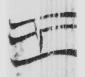王
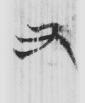又
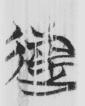{辶止㚔}
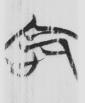命
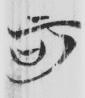可
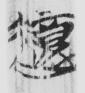復
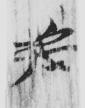弗
